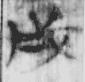戌
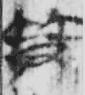笋
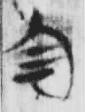○（陰）
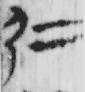弘
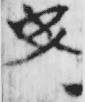𡚦
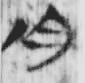舟
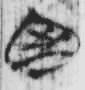室
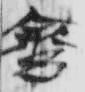舒
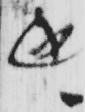臣
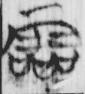霝（靈）
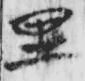里
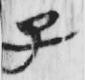子
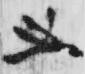之
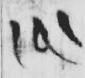州
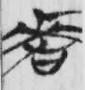差
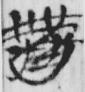○（許）
